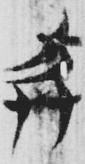兵
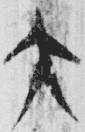大
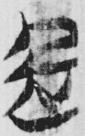○（起）
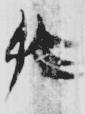於
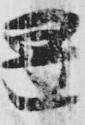是
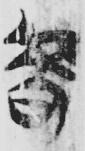唬（乎）
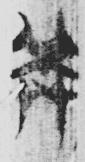○（亡）
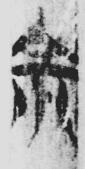宗
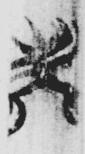鹿（戮）
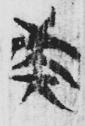族
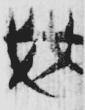戔（殘）
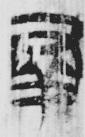群
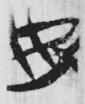𡚦（焉）
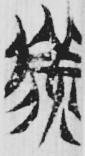備（服）
